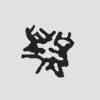燬
